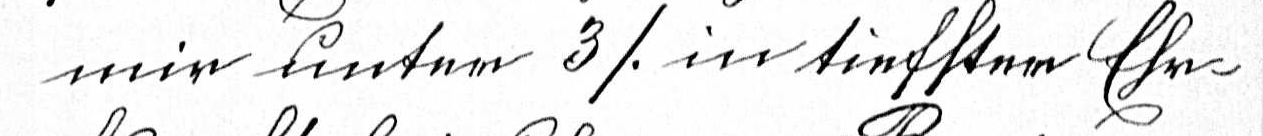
mir unter 3) in tiefster Her¬
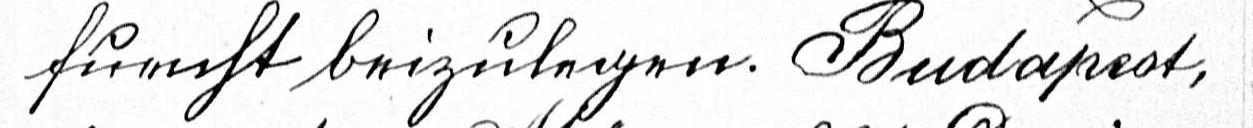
furcht beizulegen. Budapest,
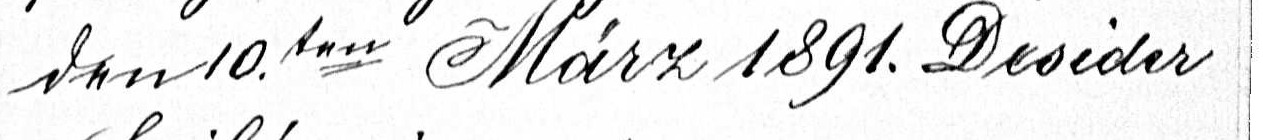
den 10ten März 1891 Desider
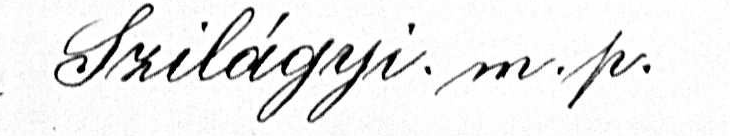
Szilágyi m.p.
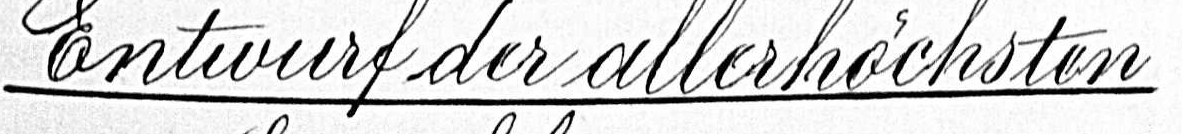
Entwurf der allerhöchsten
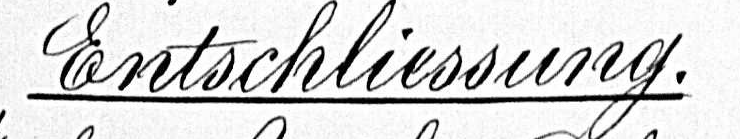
Entschliessung
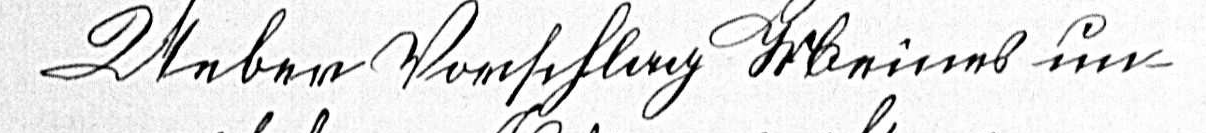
Ueber Vorschlag Meines un¬
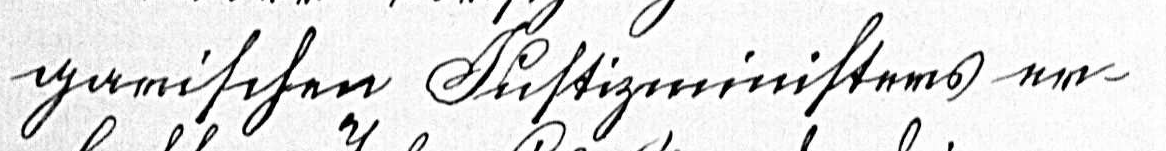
garischen Justizministers er¬
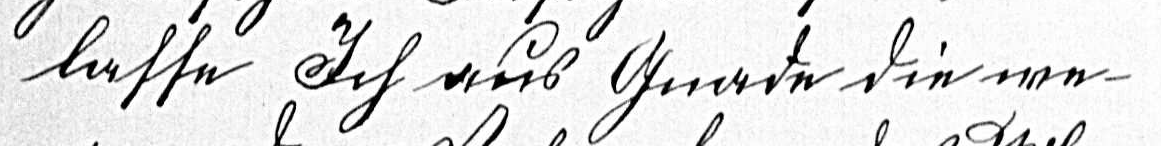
lasse Ich aus Gnade die we¬
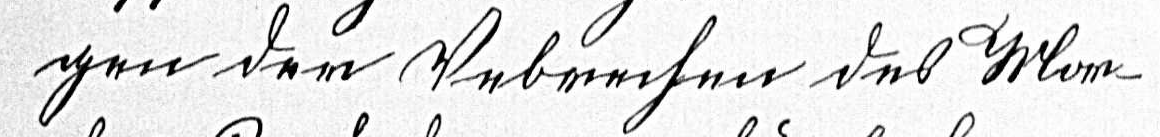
gen der Verbrechen des Mor¬
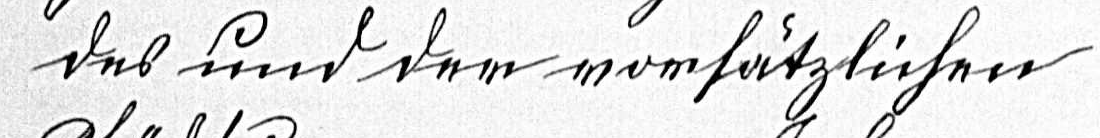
des und der vorsätzlichen
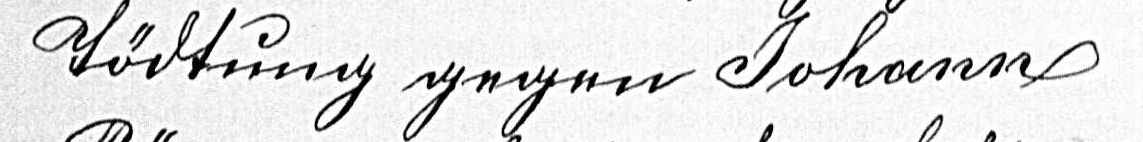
Tödtung gegen Johann
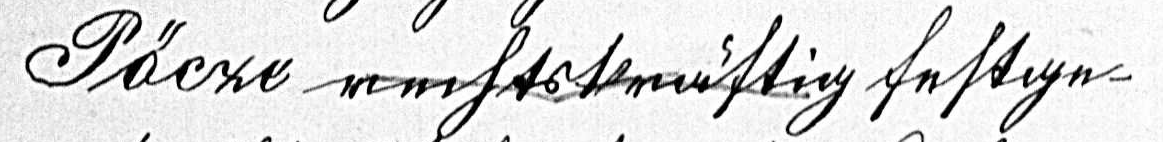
Pöcze festge¬
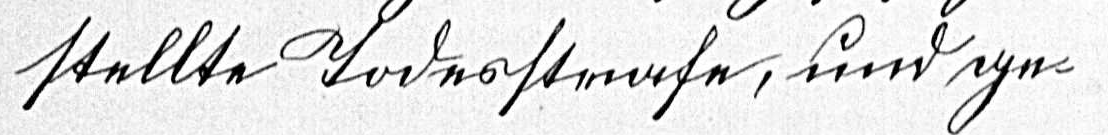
stellte Todestrafe, und ge¬
